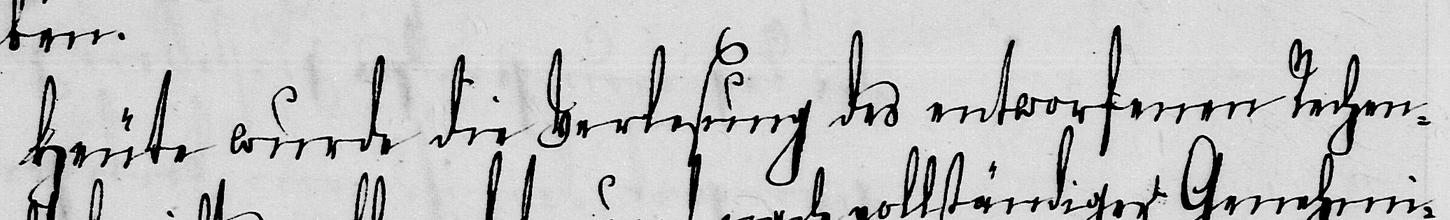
Heute wurde die Verlesung des entworfenen Rechen¬
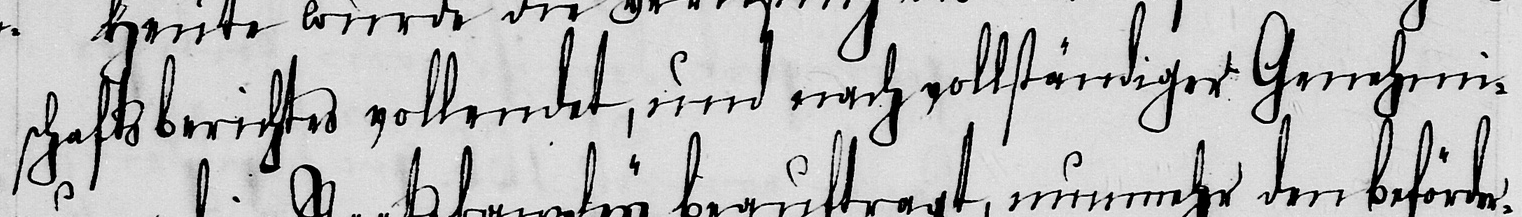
schaftsberichtes vollendet, und nach vollständiger Genehmi¬
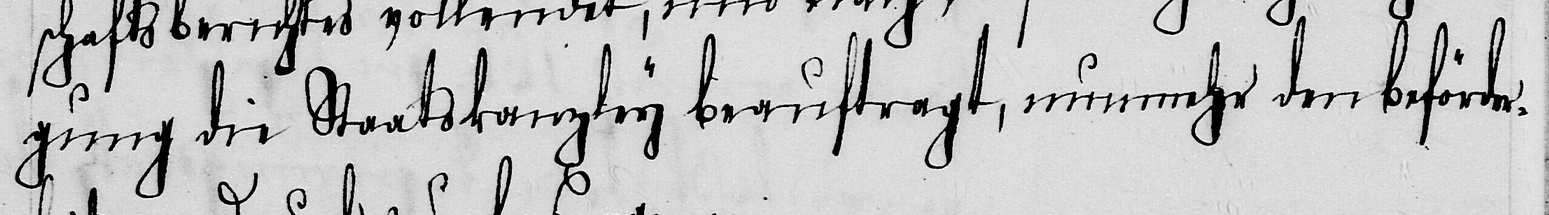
gung die Staatskanzley beauftragt, nunmehr den beförde¬
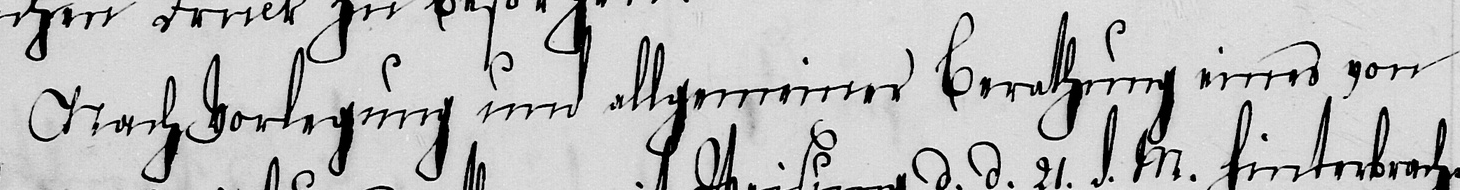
Nach Vorlegung und allgemeiner Berathung eines von
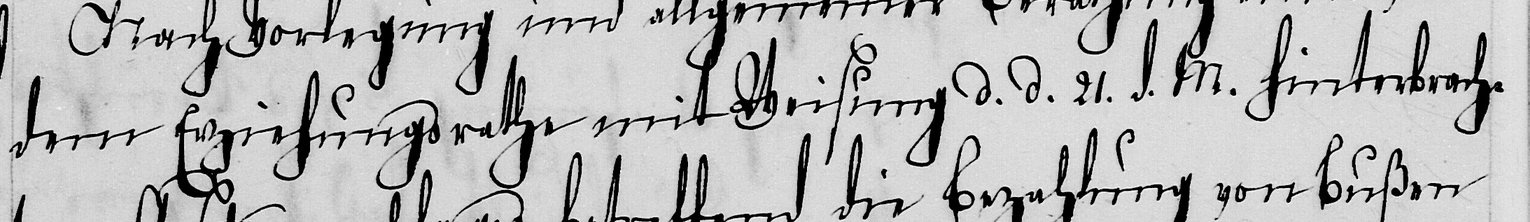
dem Erziehungsrathe mit Weisung d. d. 21. d. M. hinterbrach¬
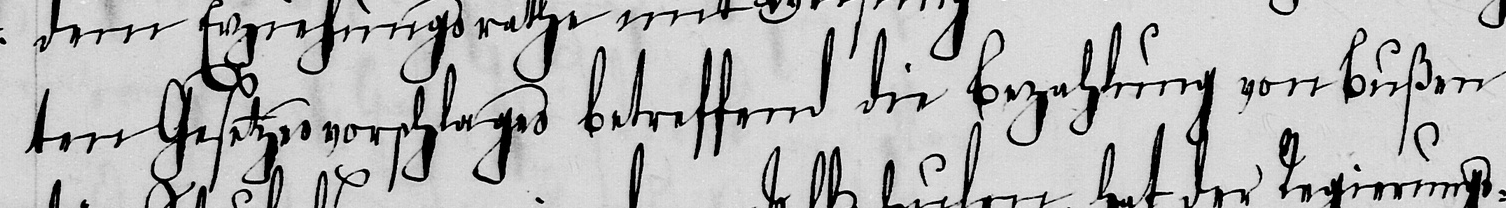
ten Gesetzesvorschlages betreffend die Bezahlung von Bußen
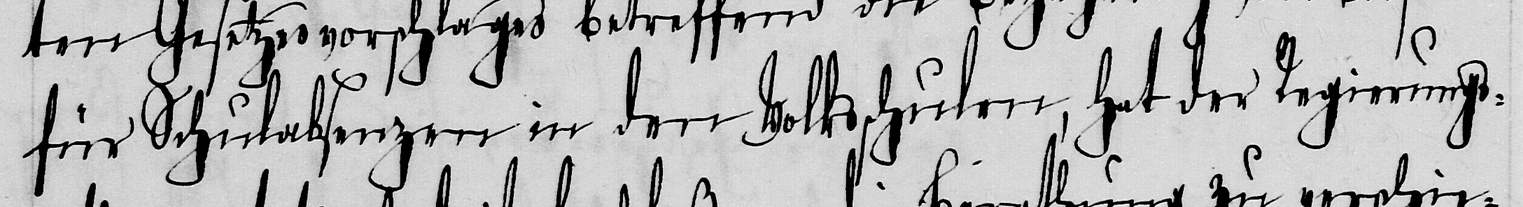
für Schulabsenzen in den Volksschulen, hat der Regierungs¬
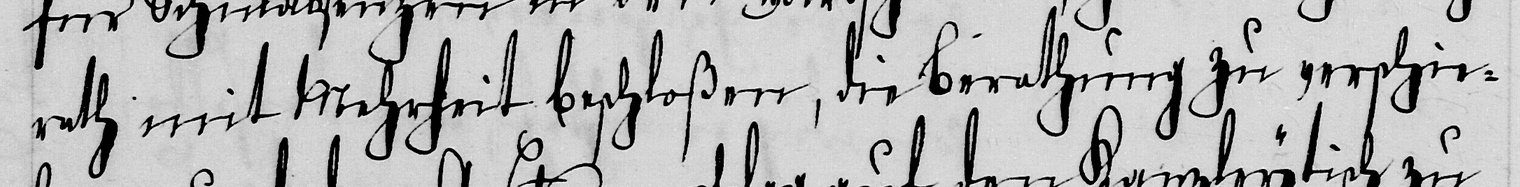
rath mit Mehrheit beschloßen, die Berathung zu verschie¬
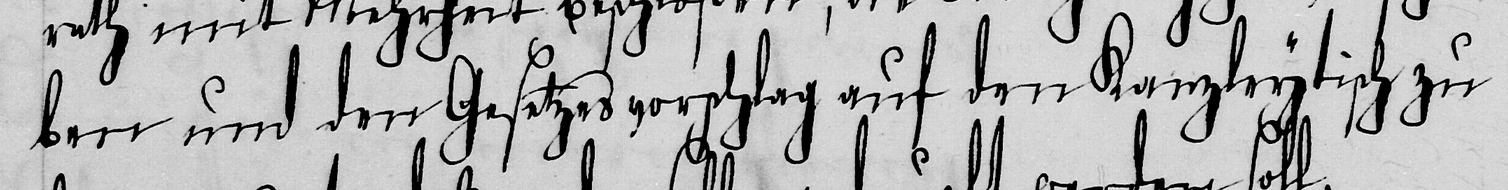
ben und den Gesetzesvorschlag auf den Kanzleytisch zu
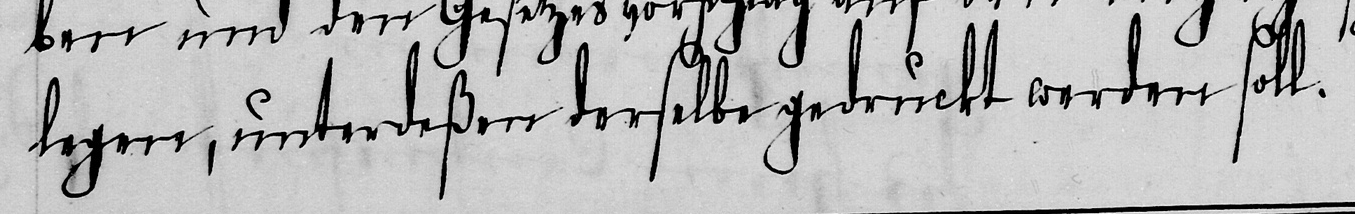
legen, unterdeßen derselbe gedruckt werden soll.
